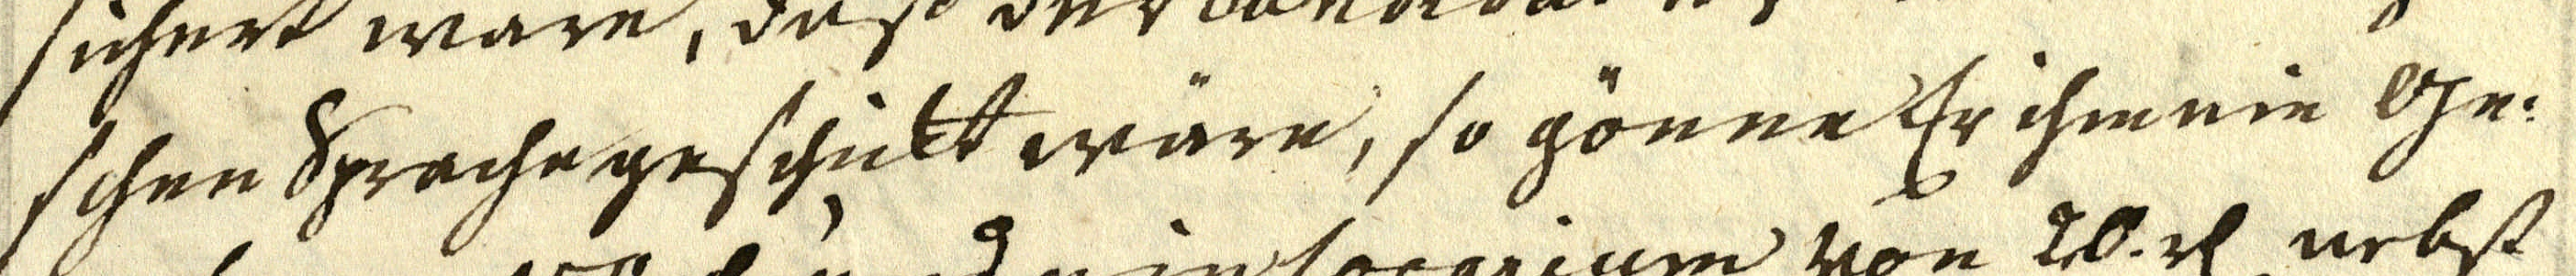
schen Sprache geschickt wäre, so gönne Er ihm ein Ge¬
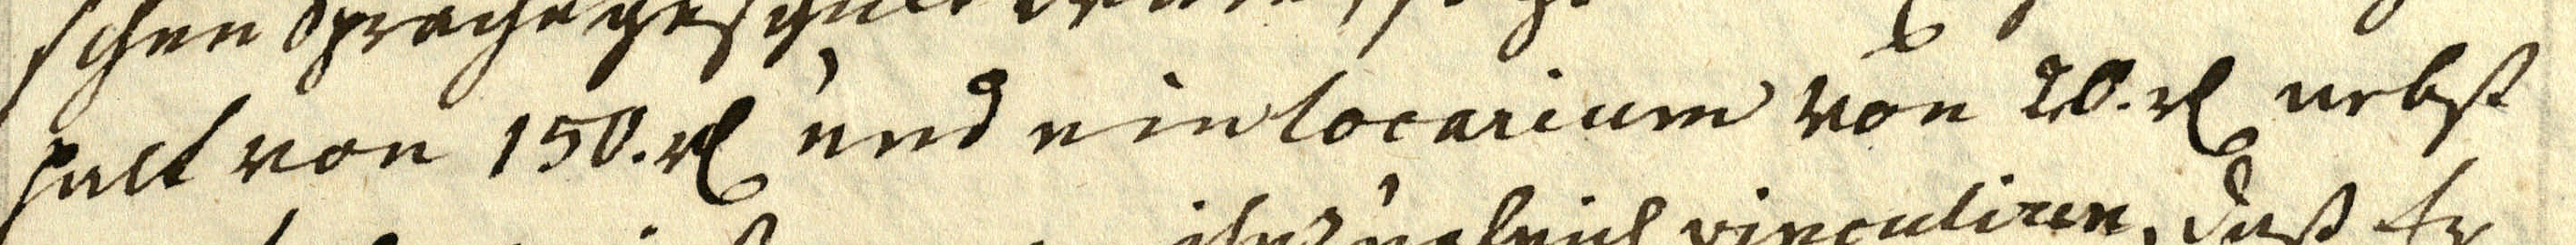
halt von 150. r und ein locarium von 20 r nebst
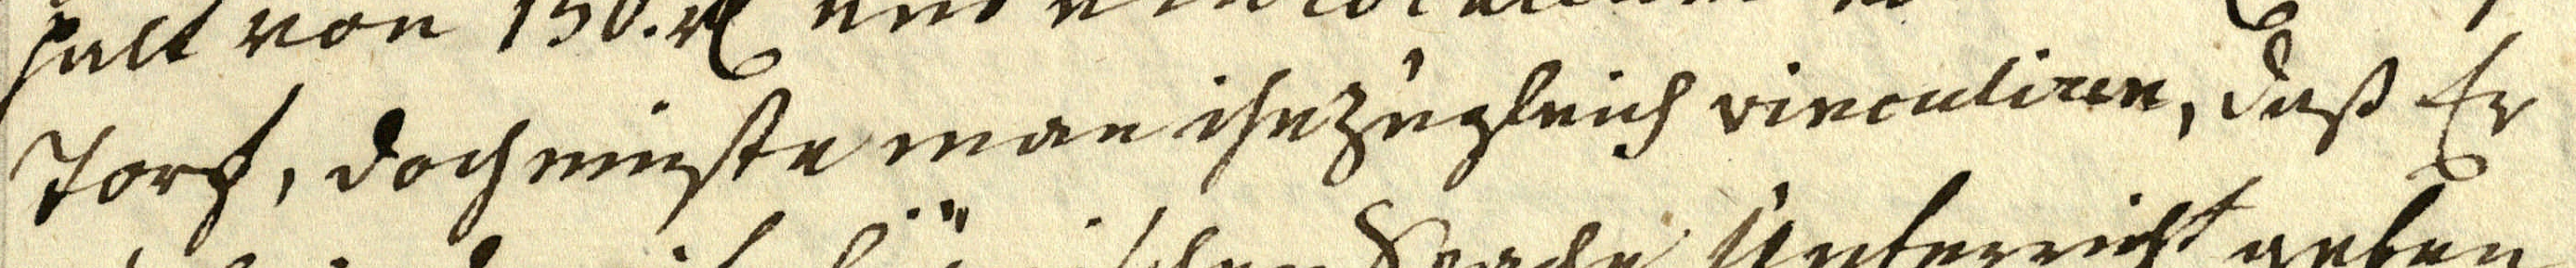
Torf, doch müste man ihn zugleich vieculiren, daß Er
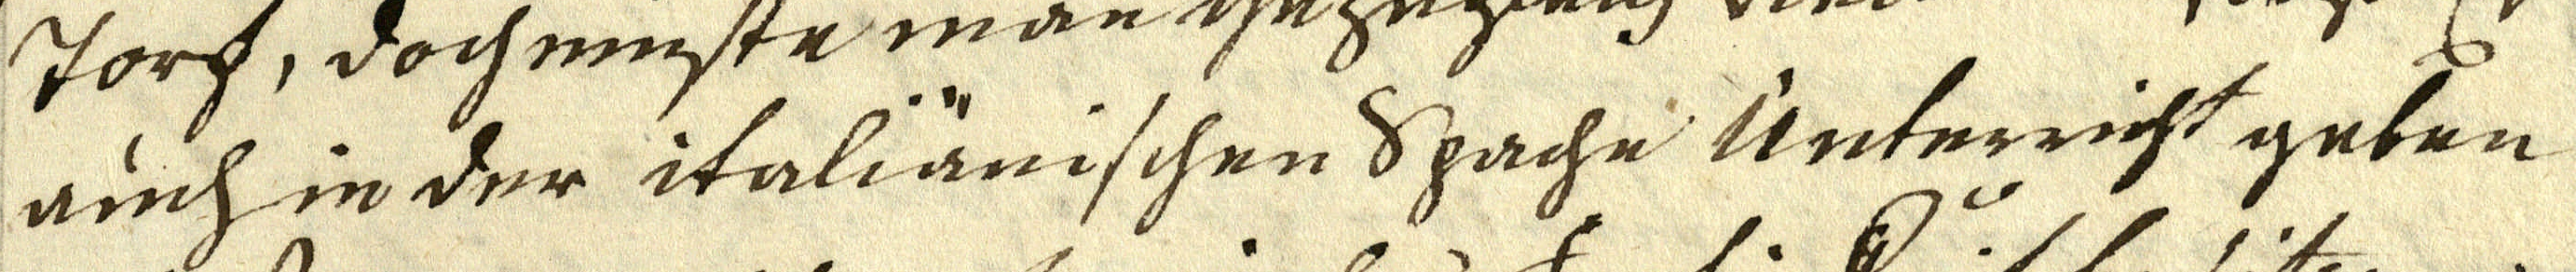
auch in der italiänischen Sprache Unterricht geben
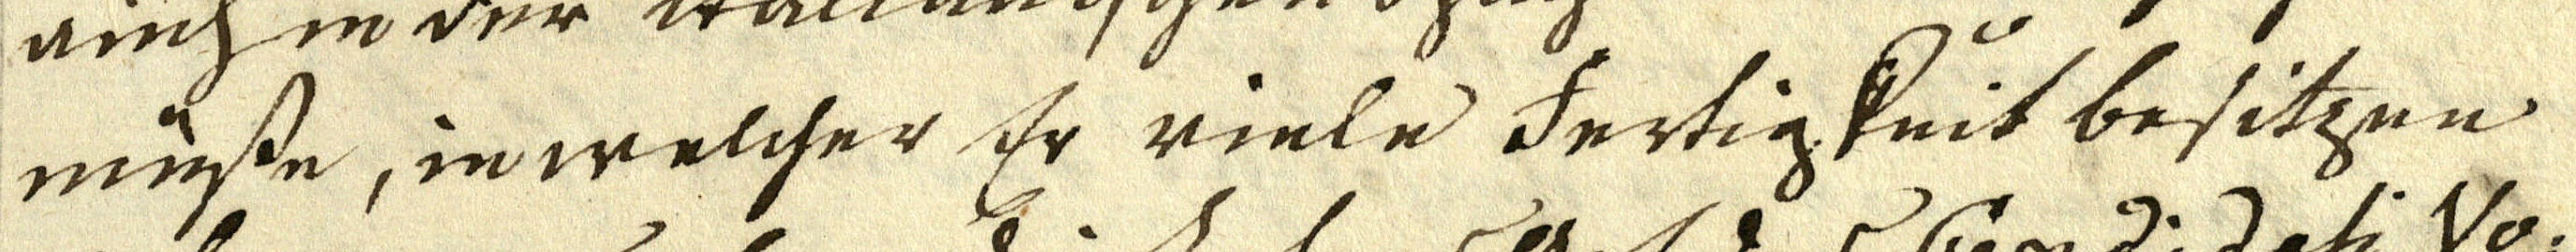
müße, in welcher Er viele Fertigkeit besitzen
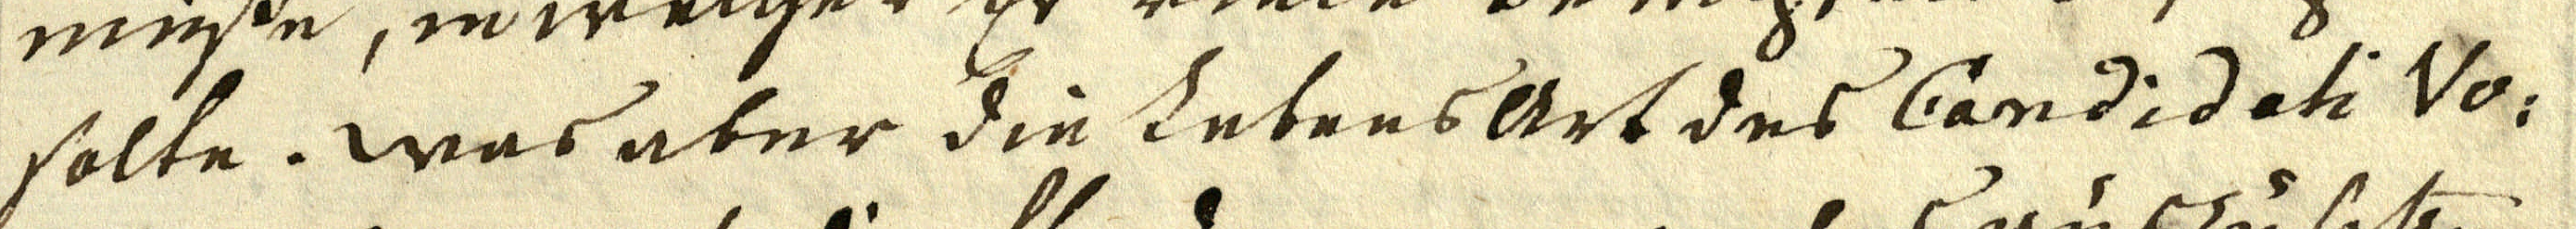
solte. was aber die Lebens Art des Candidati Vo¬
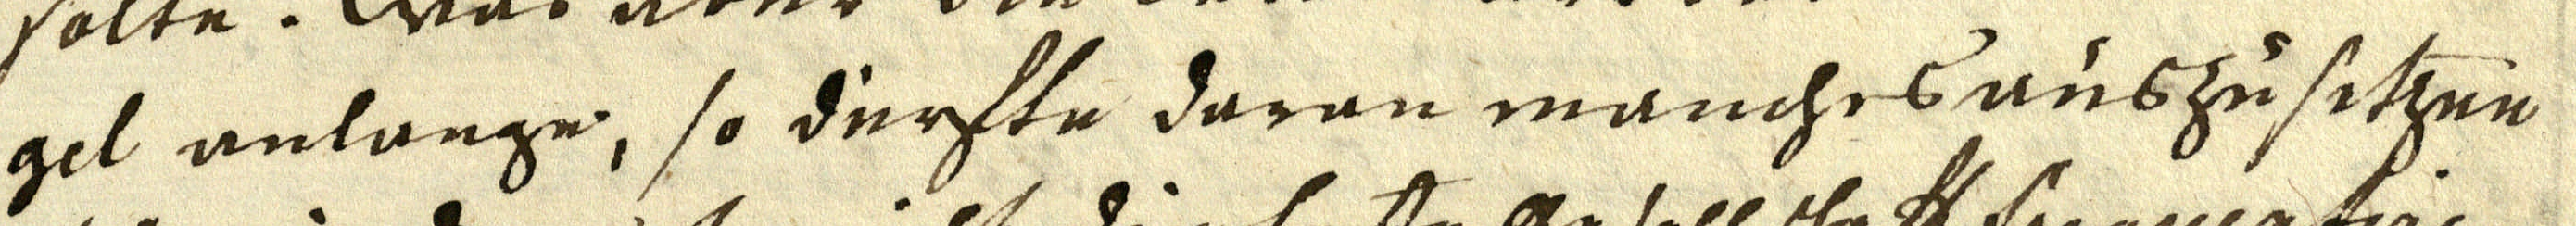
gel anlange, so dürfte daran manches auszusetzen
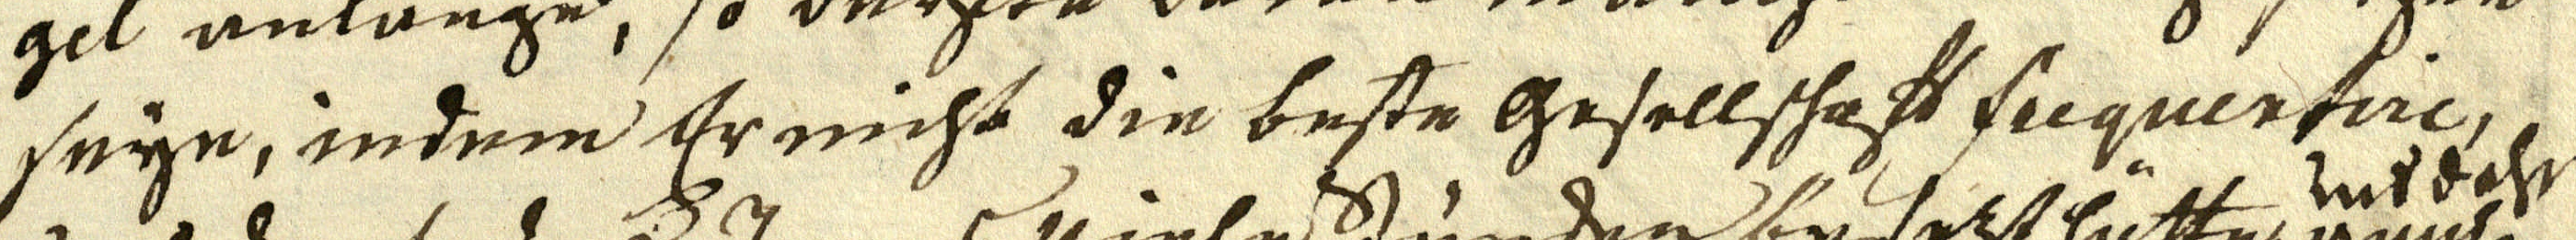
seÿn, indem Er nicht die beste Gesellschaft frequentire,
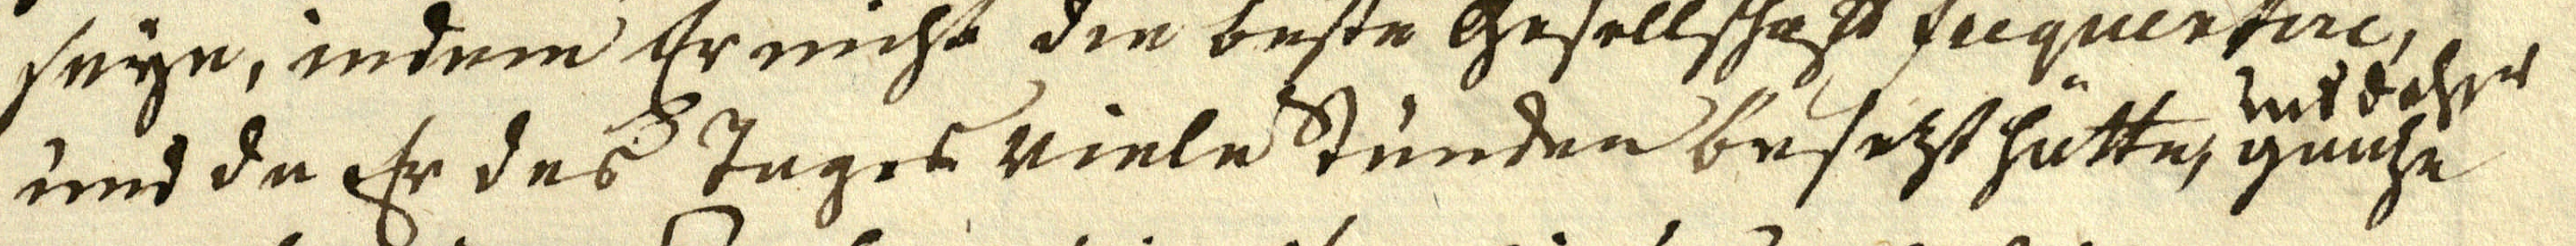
und die Er des Tages viele Stunden besezt hätte, und daher ganze
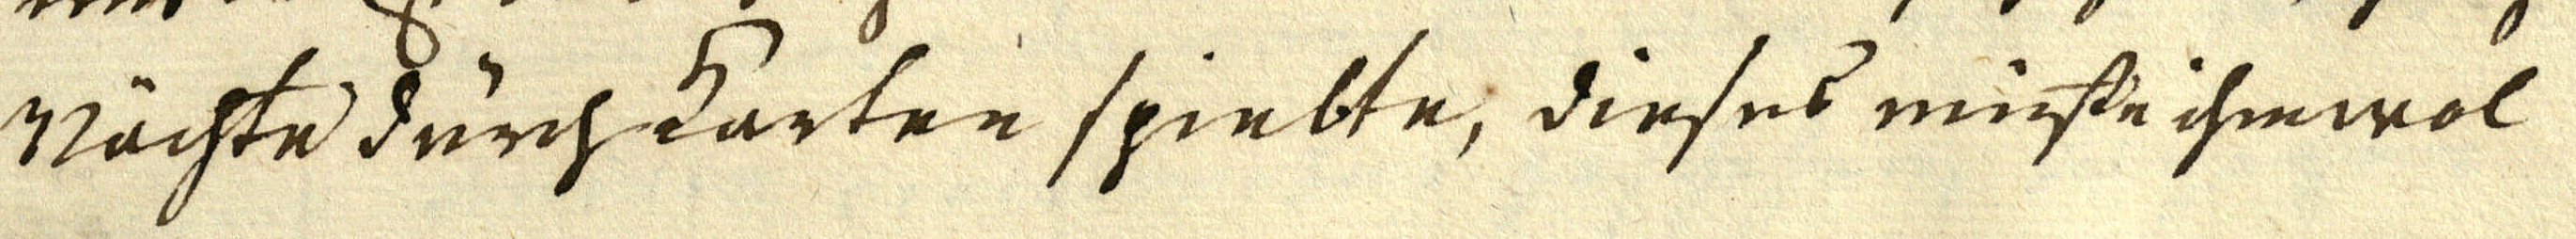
Nächte durch Karten spielte, dieses müste ihm wol
